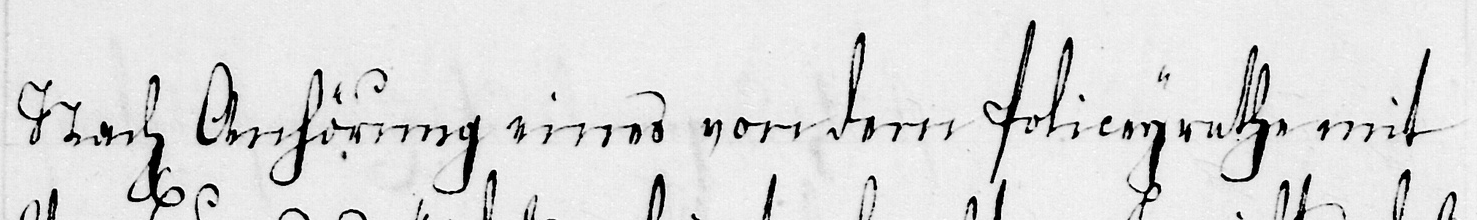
Nach Anhörung eines von dem Policeyrathe mit
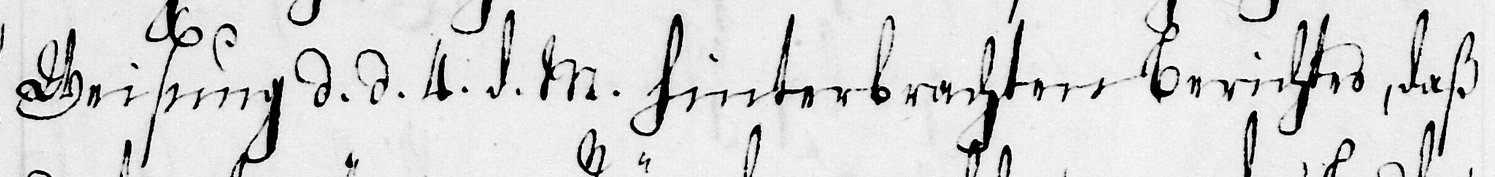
Weisung d. d. 4. d. M. hinterbrachten Berichtes, daß
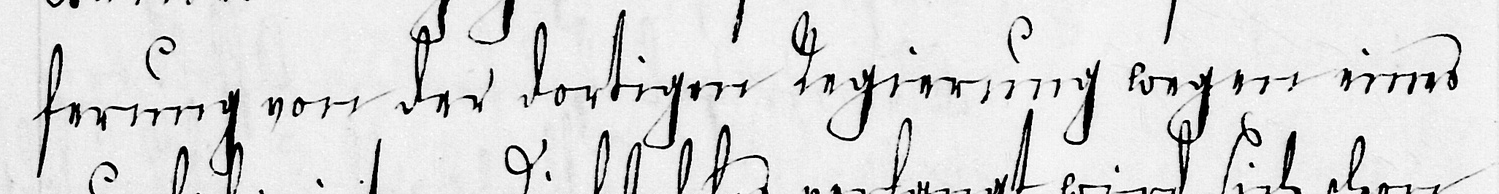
ferung von der dortigen Regierung wegen eines
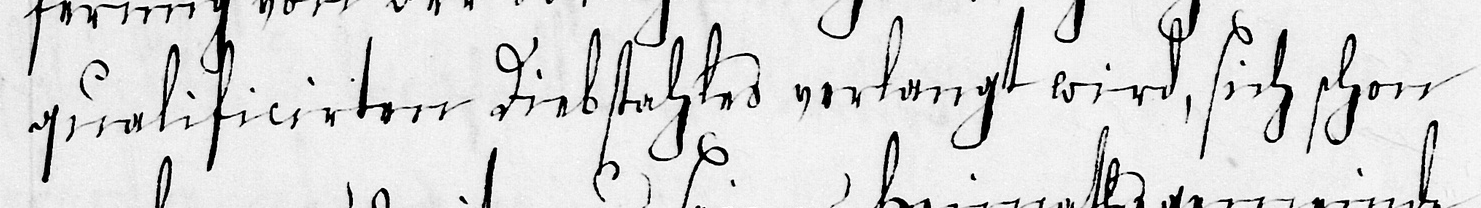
qualificirten Diebstahles verlangt wird, sich schon
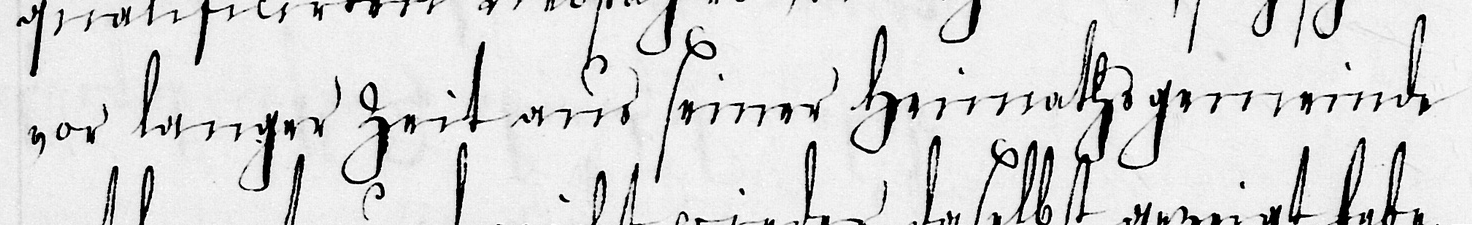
vor langer Zeit aus seiner Heimathsgemeinde
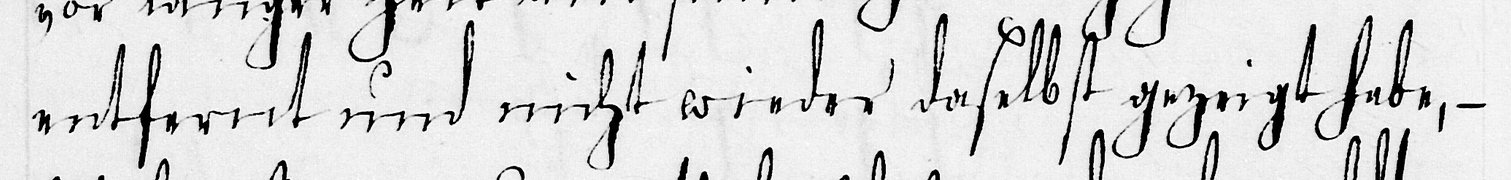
entfernt und nicht wieder daselbst gezeigt habe,
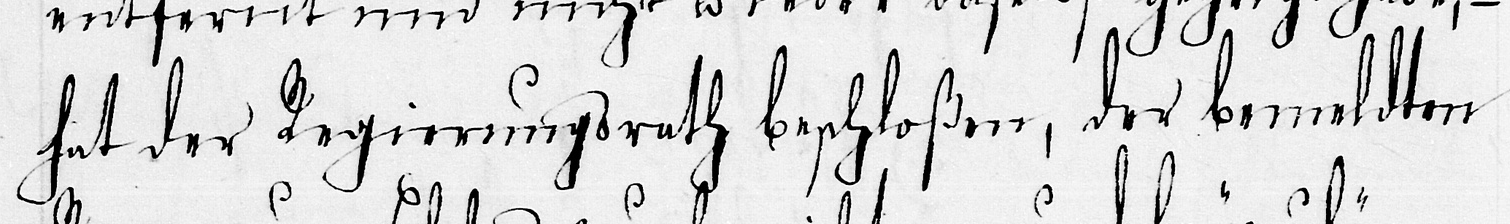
hat der Regierungsrath beschloßen, der bemeldten
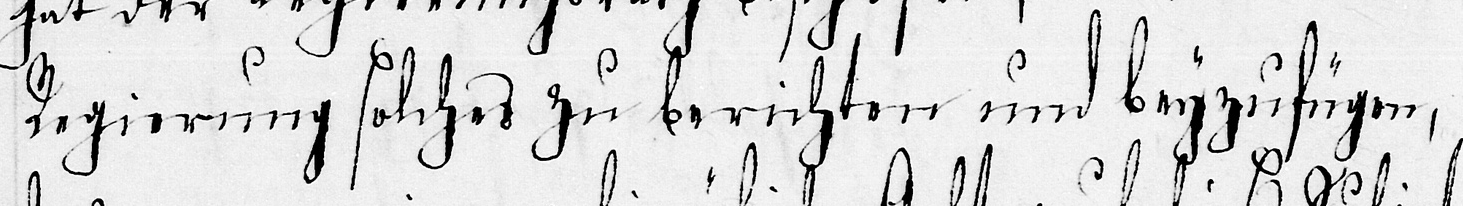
Regierung solches zu berichten und beyzufügen,
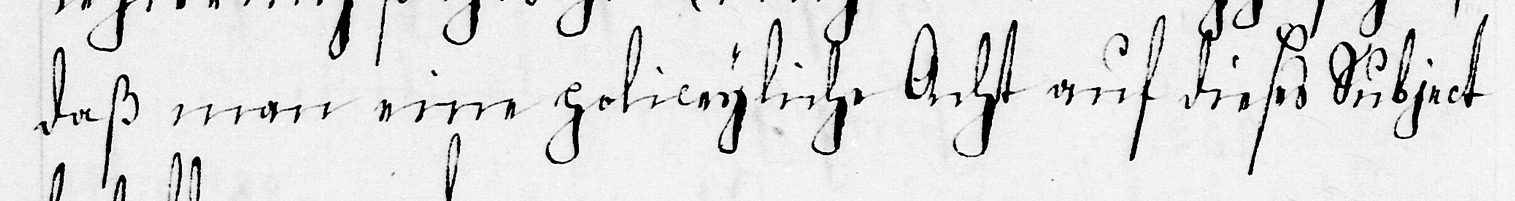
daß man eine policeyliche Acht auf dieses Subject
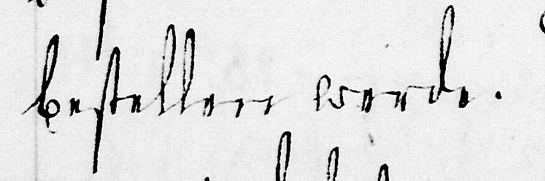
bestellen werde.
